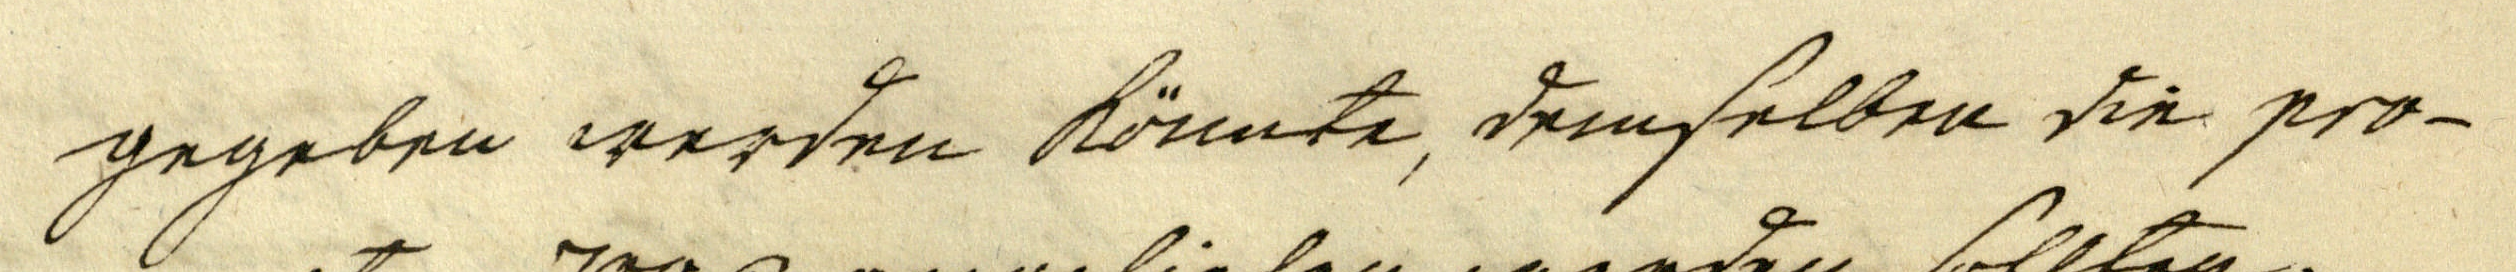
gegeben werden könnte, demselben die pro-
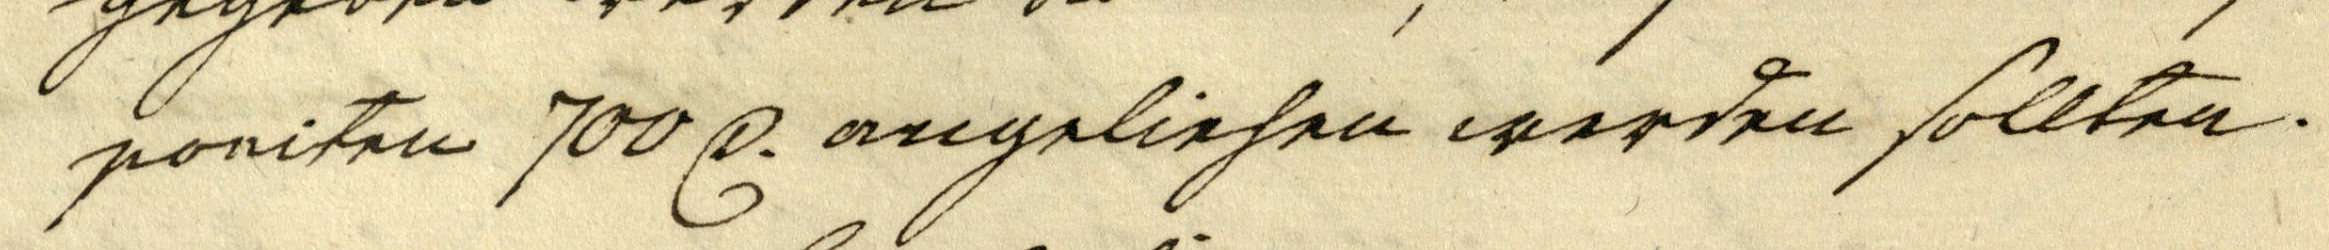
ponirten 700 rtl angeliehen werden sollten.
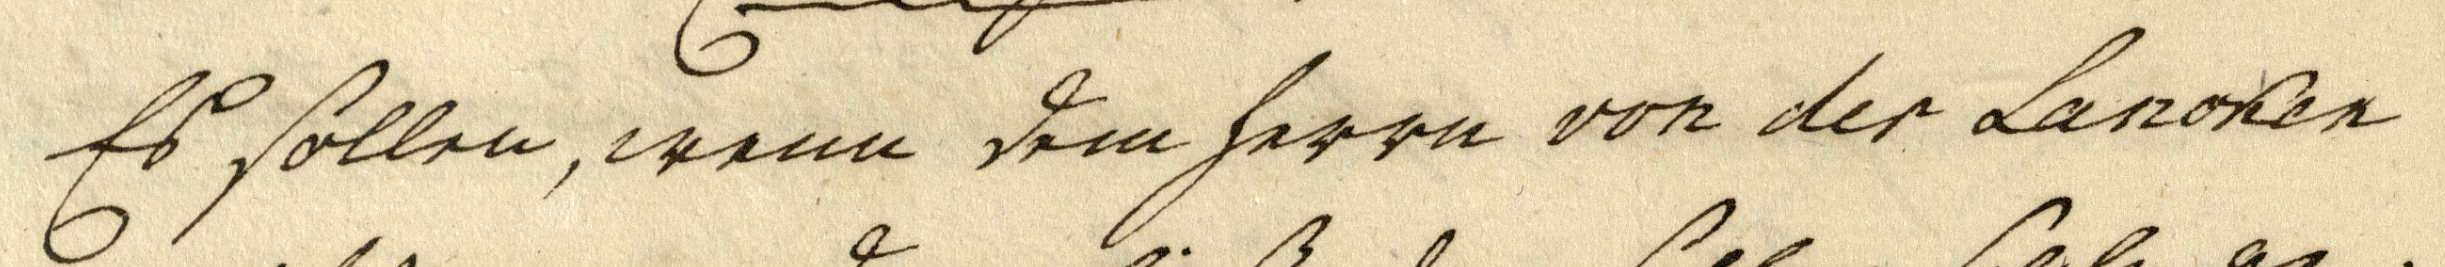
Es sollen wenn dem herrn von der Lancken
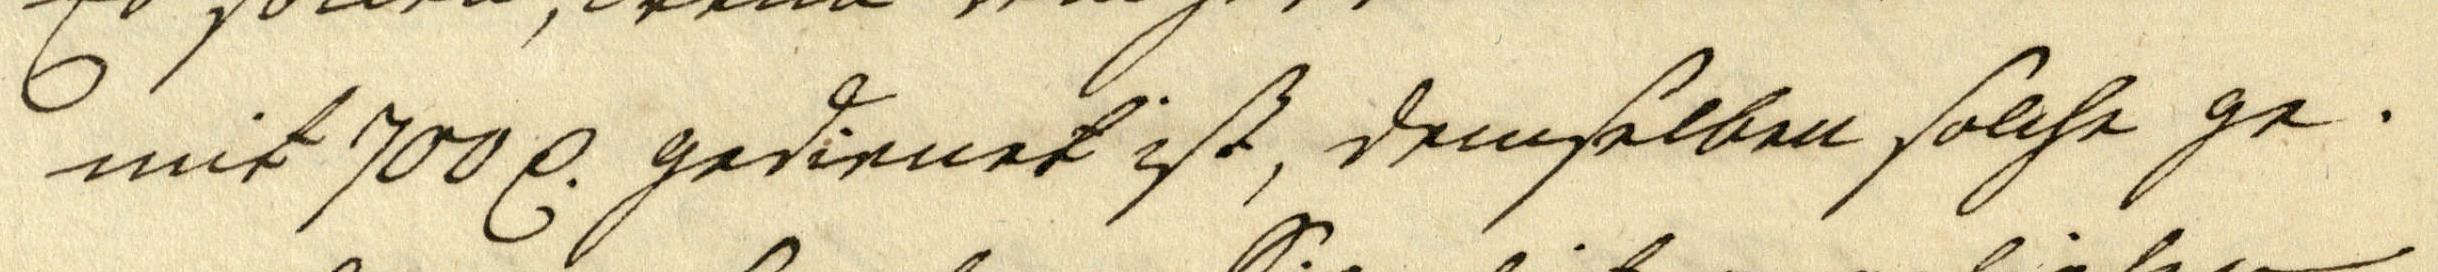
mit 700 rtl. gedienet ist, demselben solche ge-
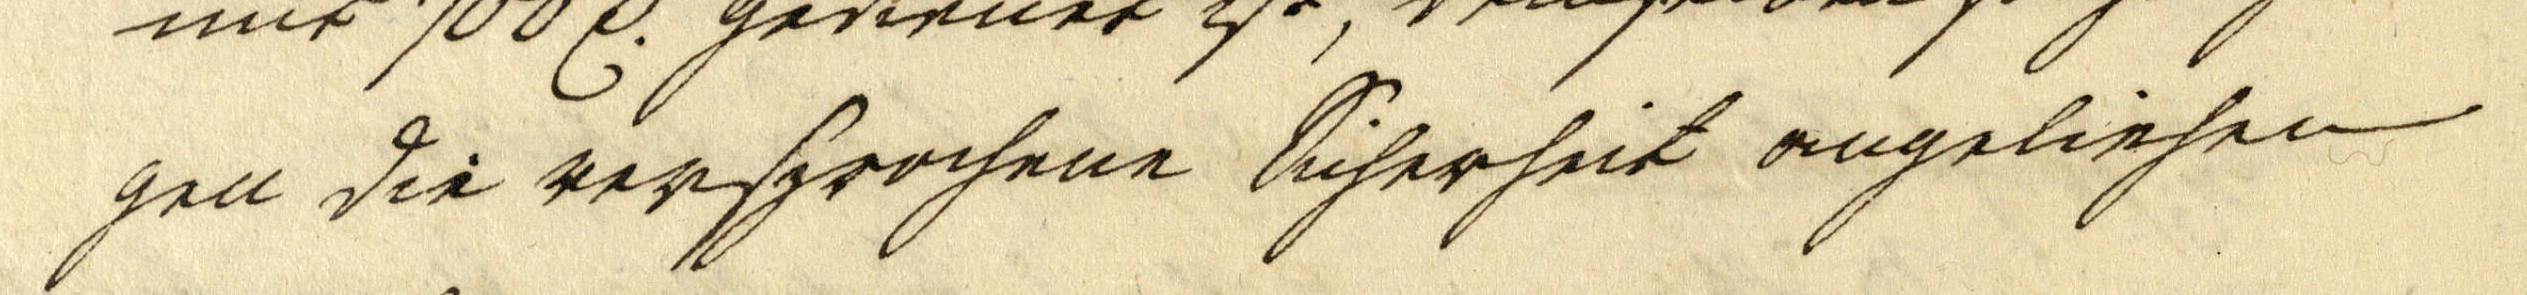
gen die versprochene Sicherheit angeliehen
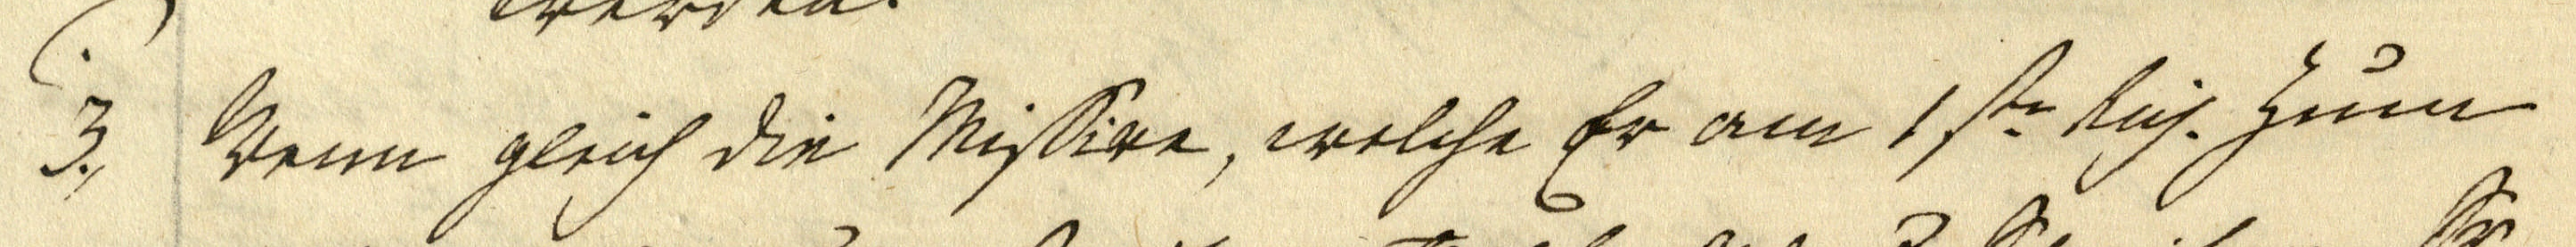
3., Wenn gleich die Missive, welche Er am 1sten huj. zum
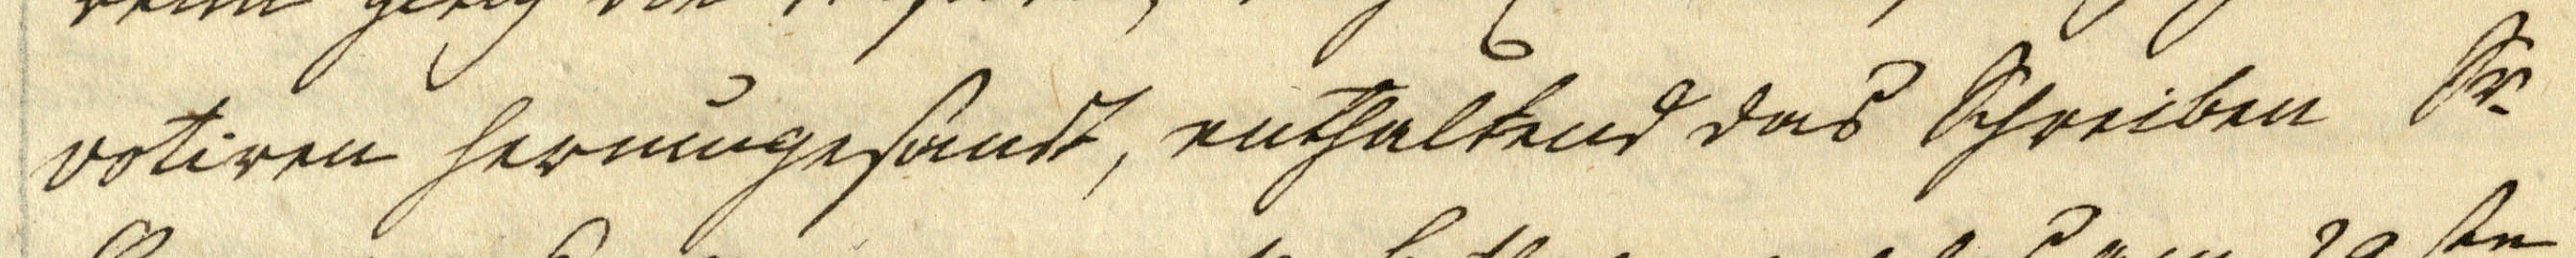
votiren herumgesandt, enthaltend das Schreiben Sr.
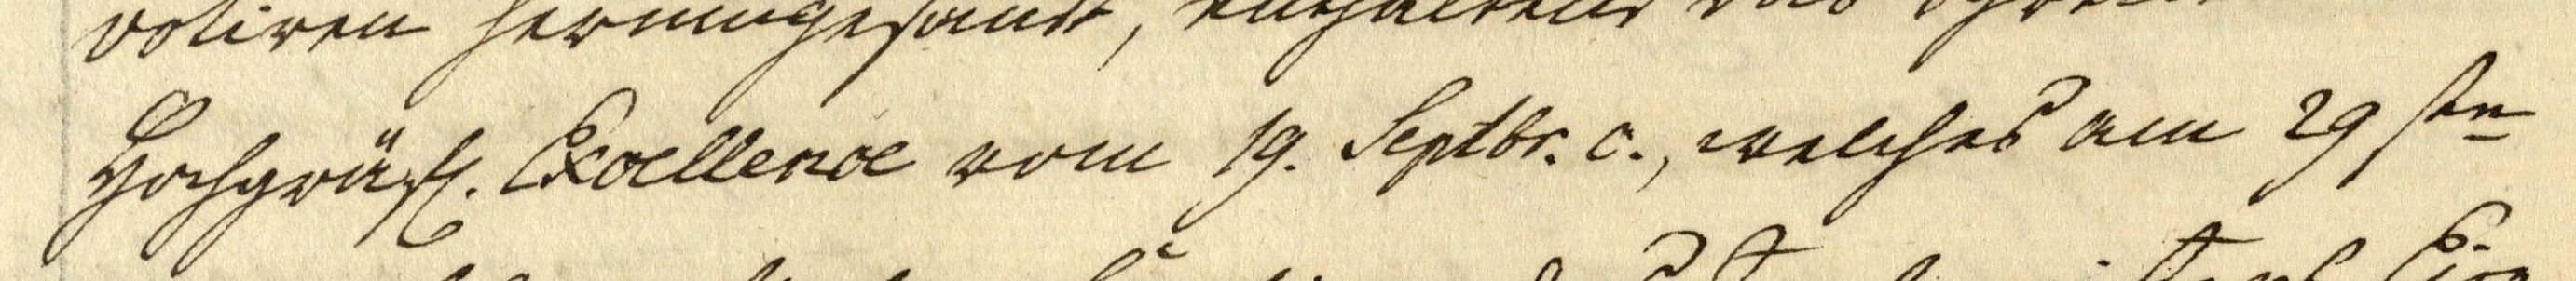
Hochgräfl. Excellence vom 19. Septbr. c., welches am 29sten
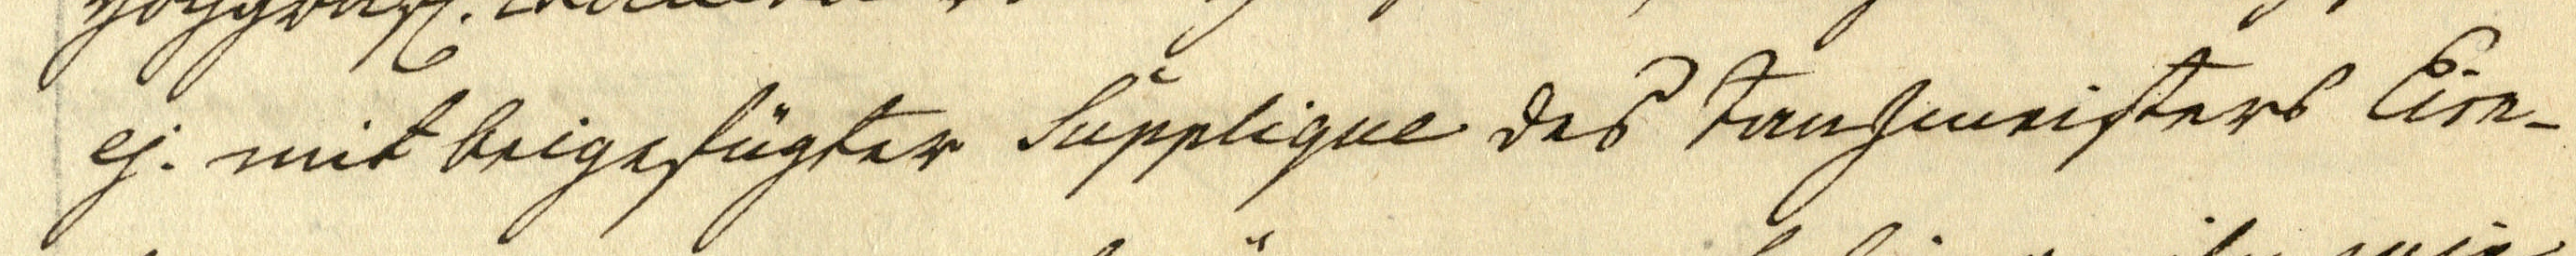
ej. mit beigefügter Supplique des Tanzmeisters Eim-
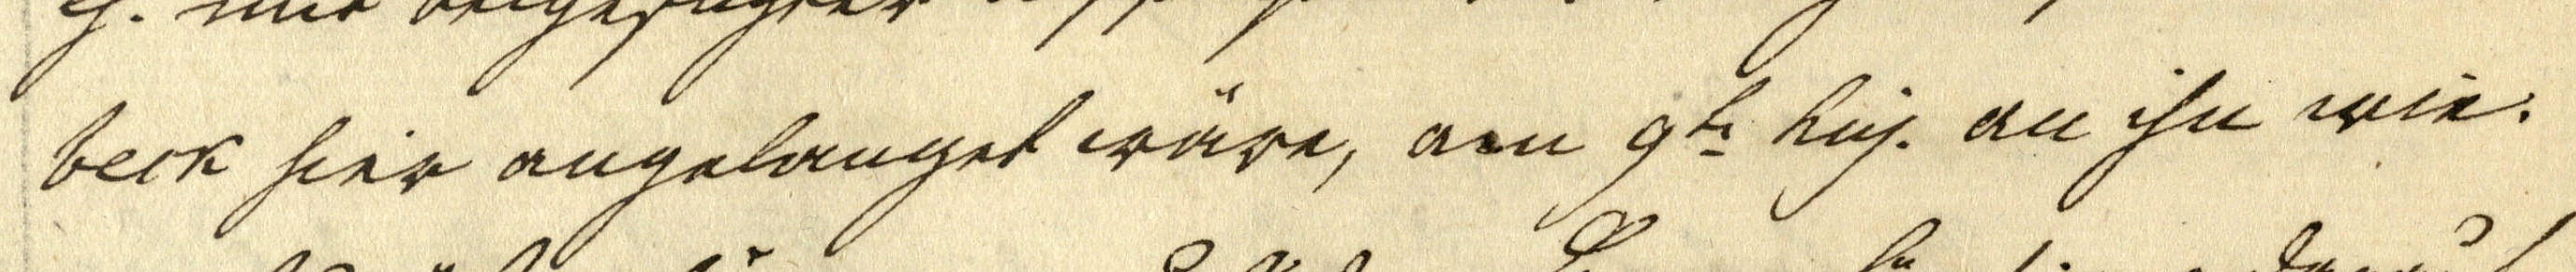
beck hier angelanget wäre, am 9ten huj. an ihn wie-
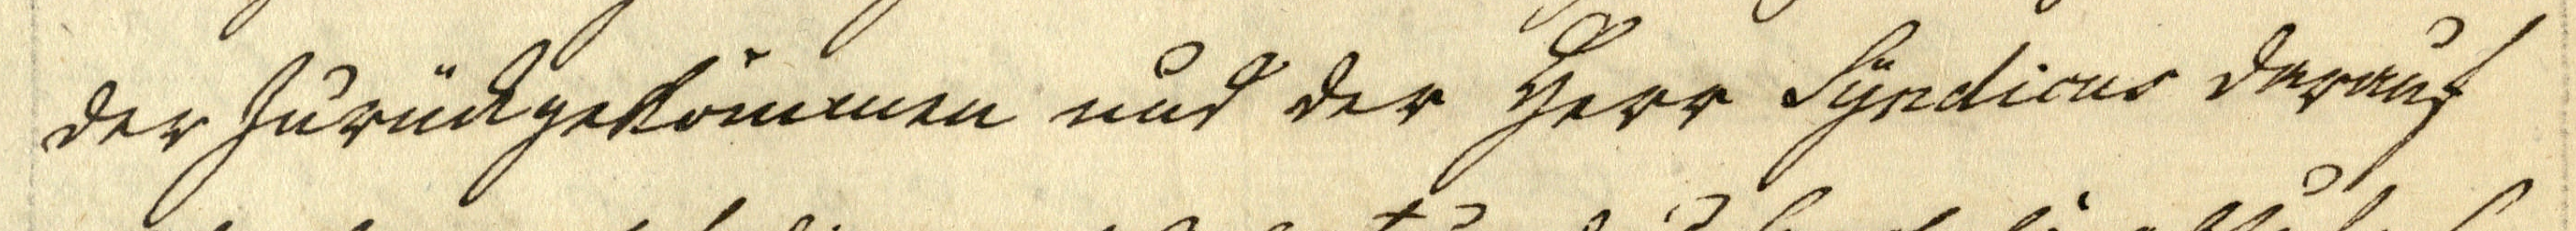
der zurückgekommen und der Herr Syndicus darauf
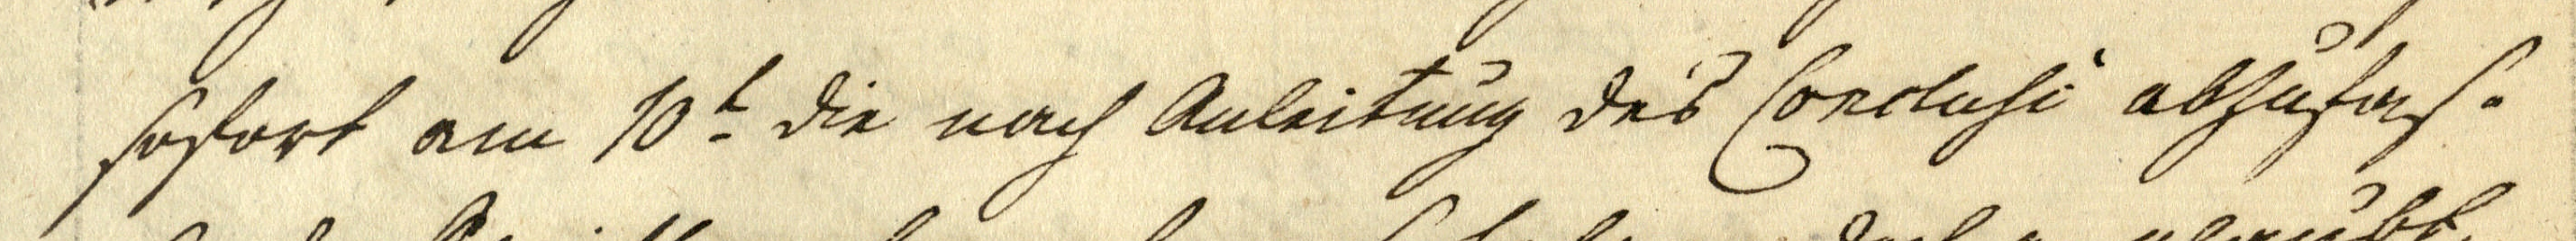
sofort am 10ten die nach Anleitung des Conclusi abzufas-
